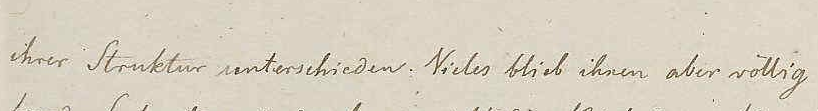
ihrer Struktur unterschieden. Vieles blieb ihnen aber völlig
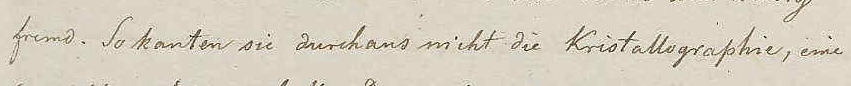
fremd. So kanten sie durchaus nicht die Kristallographie, eine
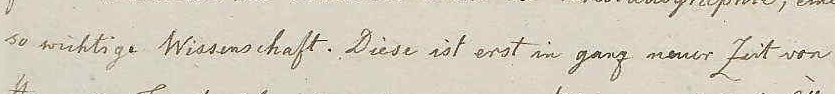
so wichtige Wissenschaft. Diese ist erst in ganz neuer Zeit von
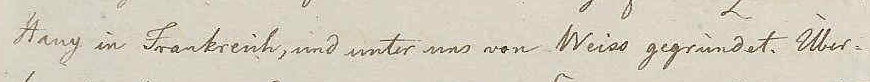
Hauy in Frankreich, und unter uns von Weiss gegründet. Über-
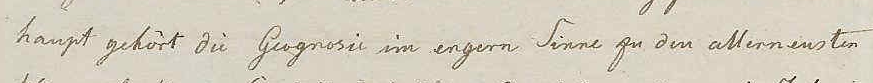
haupt gehört die Geognosie im engern Sinne zu den allerneusten
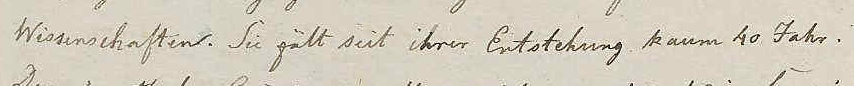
Wissenschaften. Sie zält seit ihrer Entstehung kaum 40 Jahr.
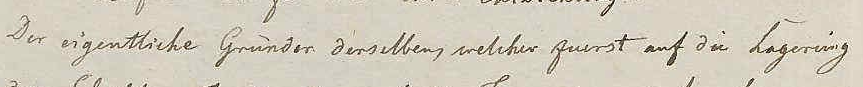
Der eigentliche Gründer derselben, welcher zuerst auf die Lagerung
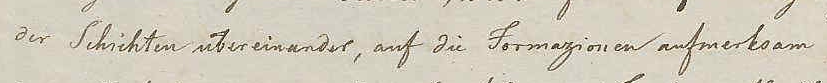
der Schichten übereinander, auf die Formazionen aufmerksam
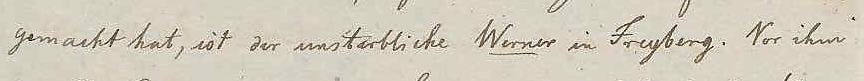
gemacht hat, ist der unsterbliche Werner in Freyberg. Vor ihm
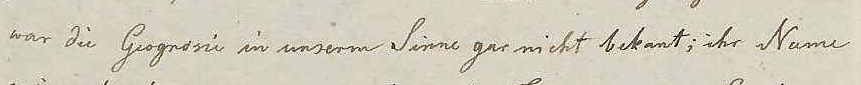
war die Geognosie in unserm Sinne gar nicht bekant; ihr Name
